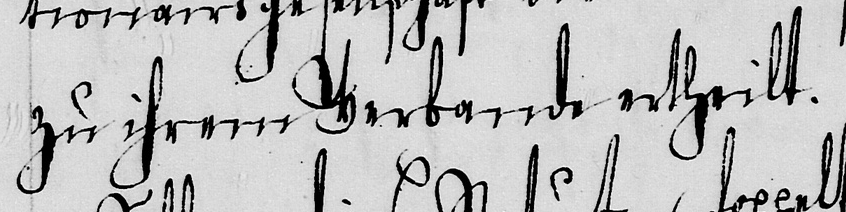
zu ihrem Verbande ertheilt.
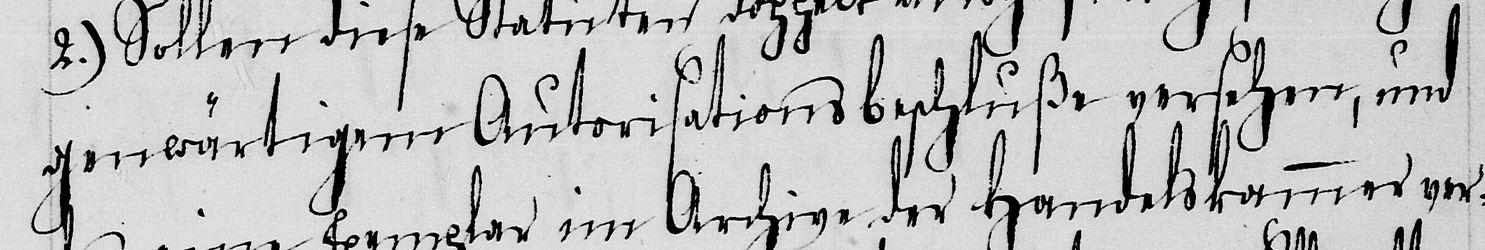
genwärtigem Autorisationsbeschluße versehen, und
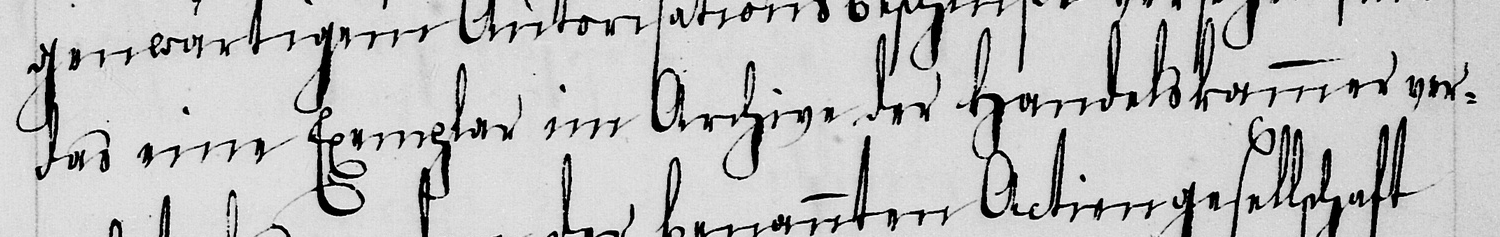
das eine Exemplar im Archive der Handelskammer ver¬
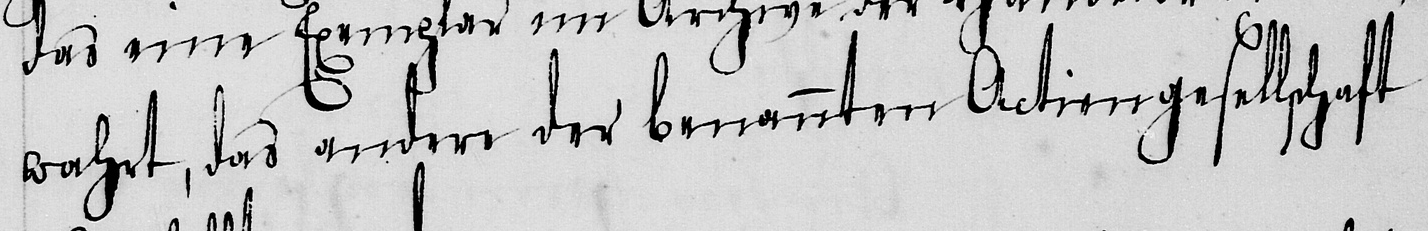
wahrt, das andere der benannten Actiengesellschaft
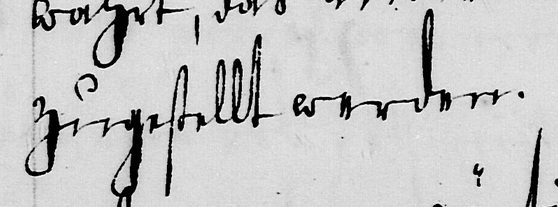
zugestellt werden.
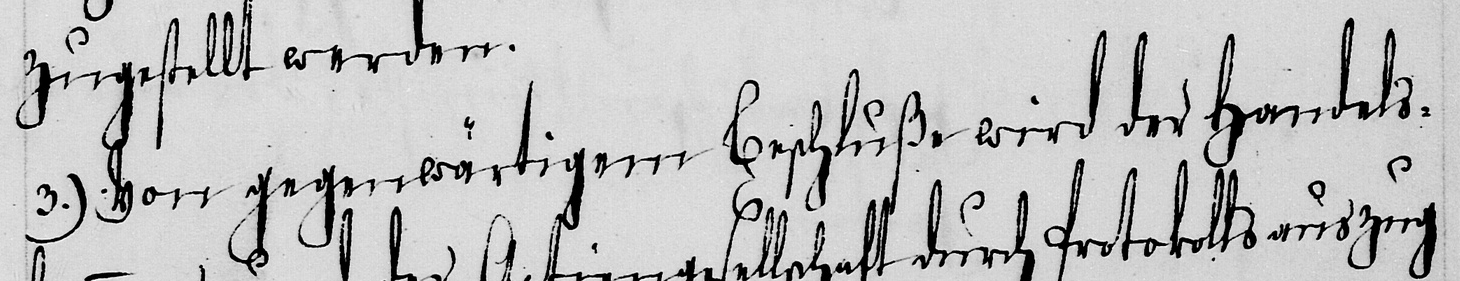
3.) Von gegenwärtigem Beschluße wird der Handels¬
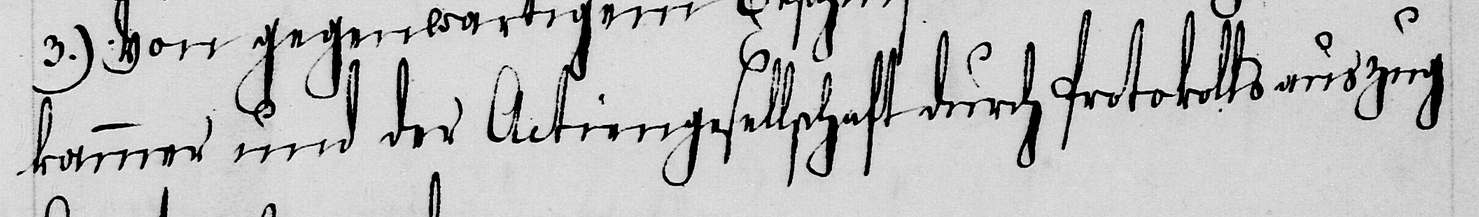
kammer und der Actiengesellschaft durch Protokollsauszug
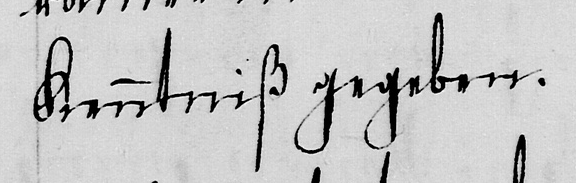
Kenntniß gegeben.
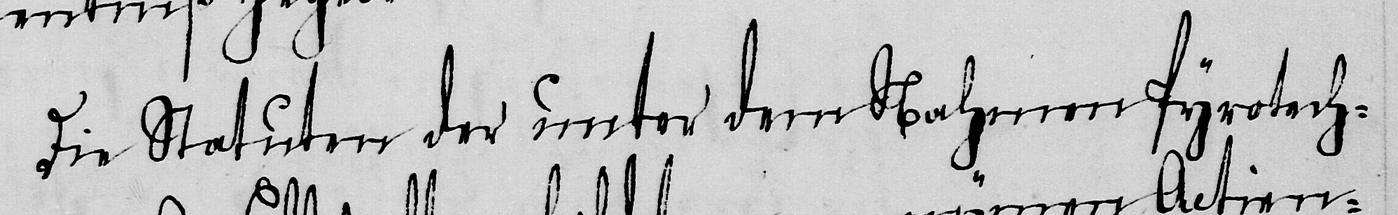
Die Statuten der unter dem Nahmen Pyrotech¬
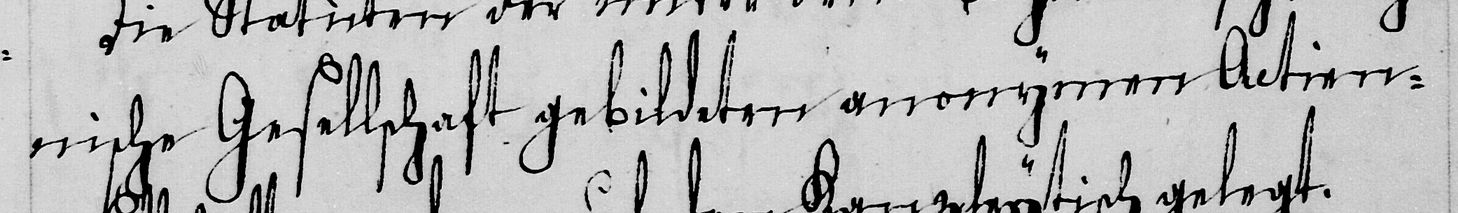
nische Gesellschaft gebildeten anonymen Actien¬
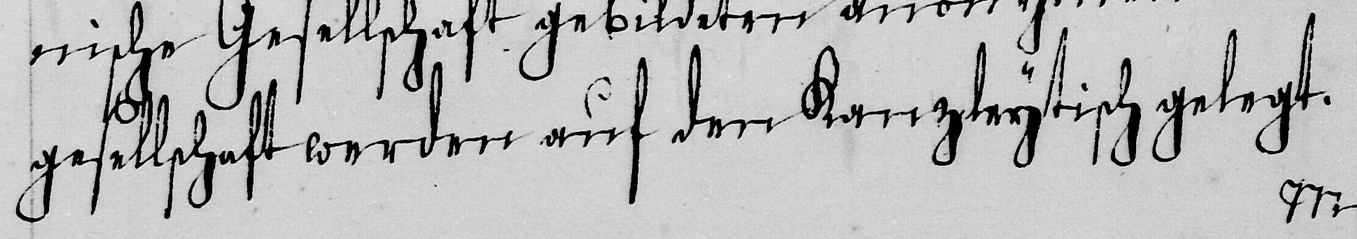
gesellschaft werden auf den Kanzleytisch gelegt.
